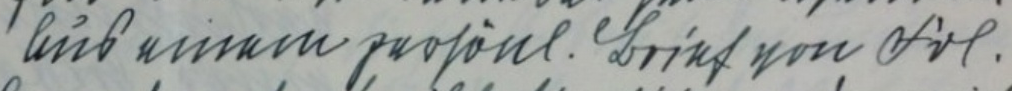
Aus einem persönl. Brief von Frl.
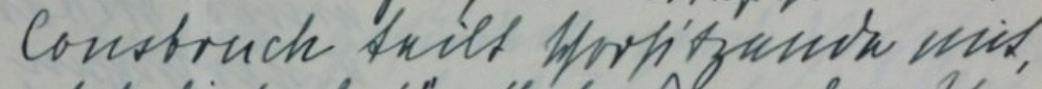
Consbruch teilt Vorsitzende mit
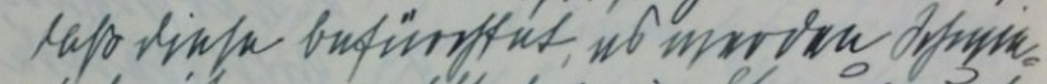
da0 diese befürchtet es werde Schwie
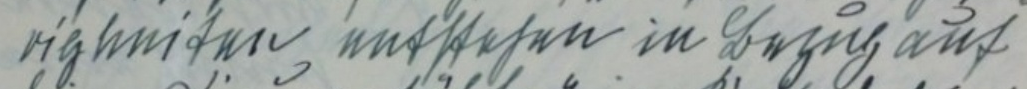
rigkeiten entstehen in Bezug auf
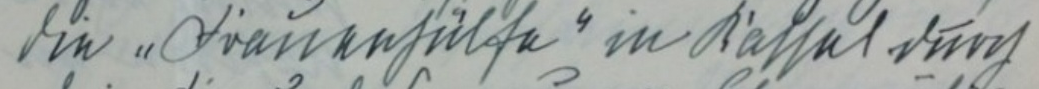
die „Freuenhülfe" in Kassel. Durch
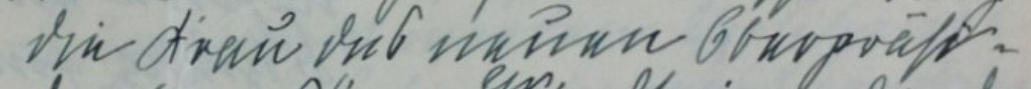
die Frau des neuen Oberpräsi
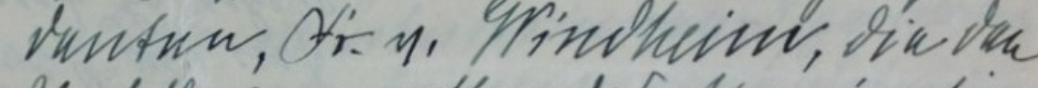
denten, Fr. v. Wundheim, die den
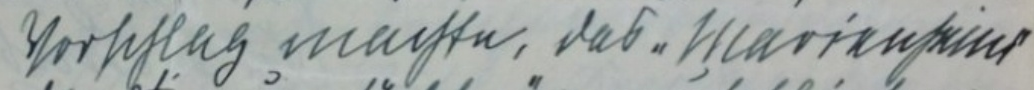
Vorschlag machte das „Marienheim"
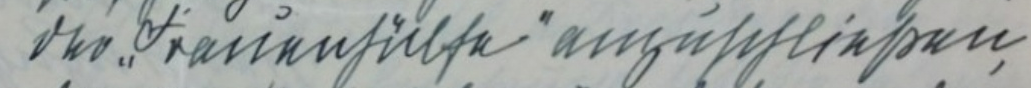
der „Frauenhülfe" anzuschließen
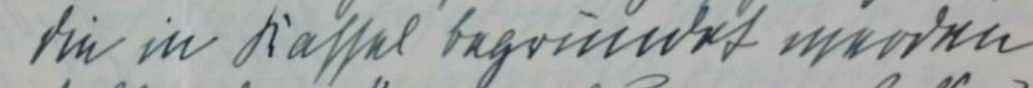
die in Kassel begründet werden
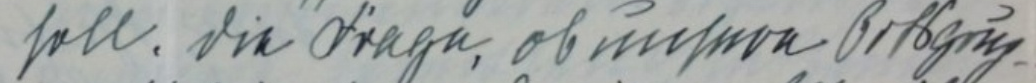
soll. Die Frage ob unsere Ortsgrup
